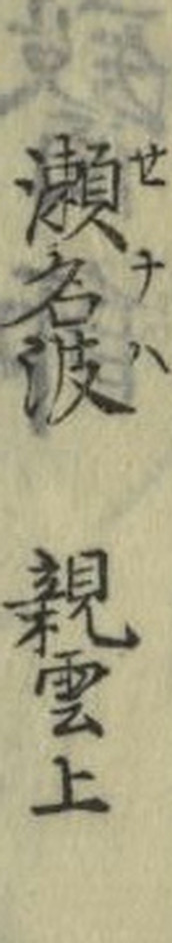瀬名波親雲上
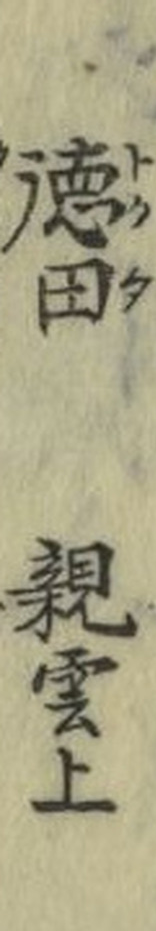徳田親雲上
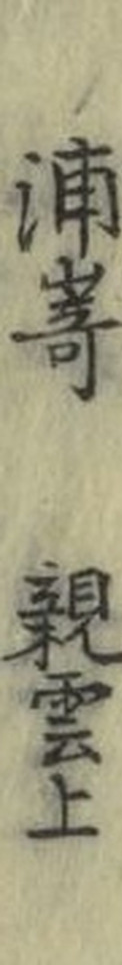浦嵜親雲上
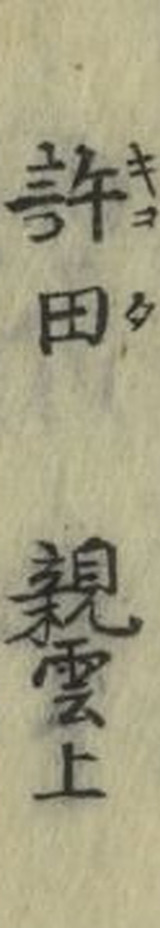許田親雲上

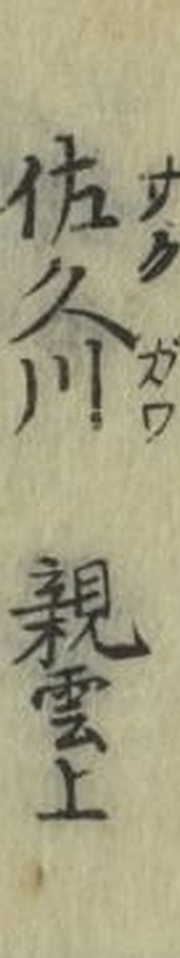佐久川親雲上
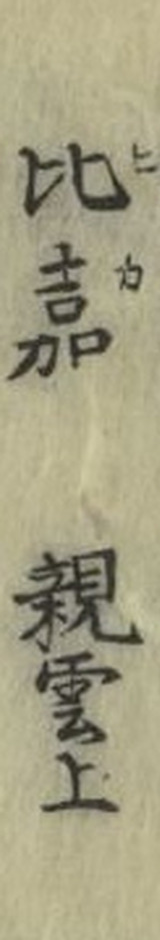比嘉親雲上
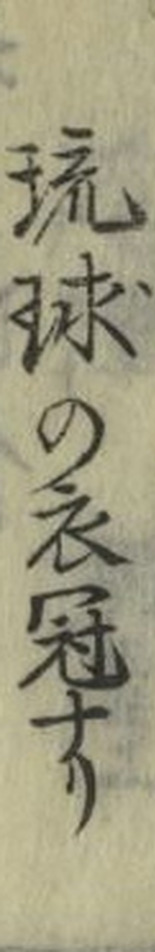琉球の衣冠ナリ
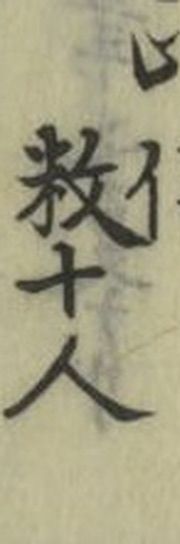数十人
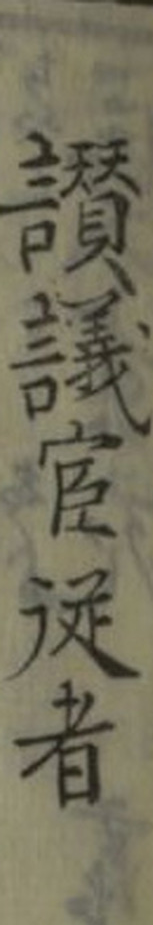讃議宦従者
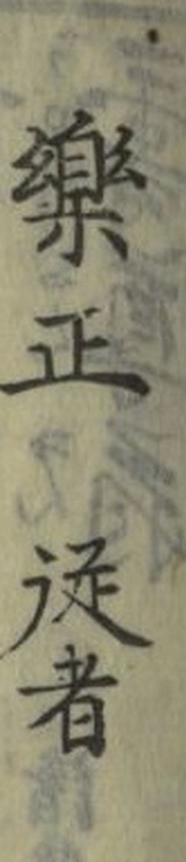樂正従者
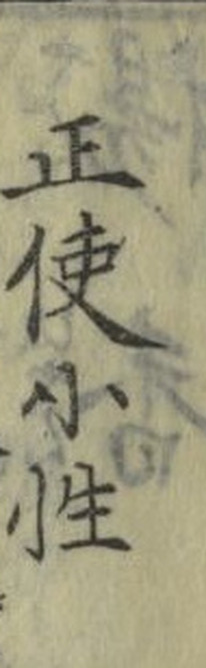正使小性
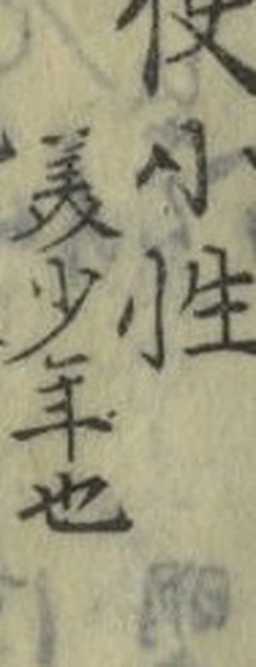美少年也
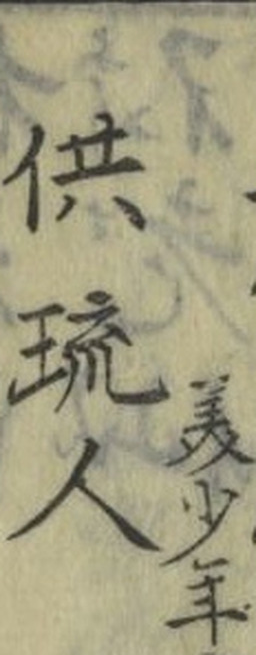供琉人
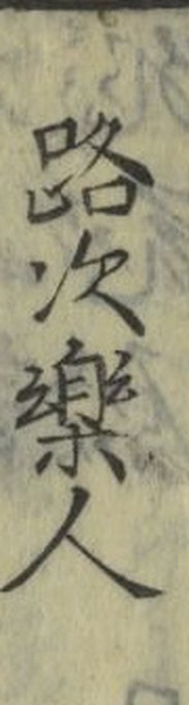路次樂人
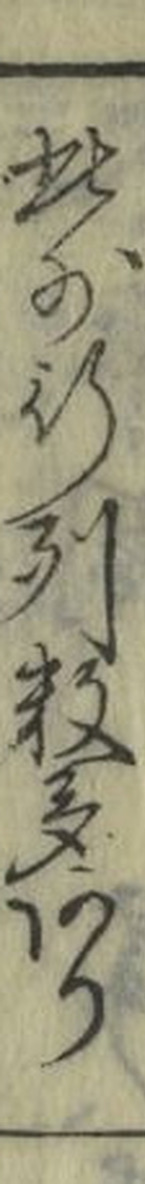此外行列数多あり
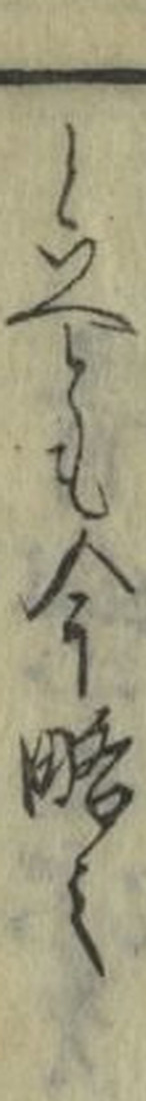といへとも今略之
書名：新板 琉球人行列記
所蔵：University of the Ryukyus Library
